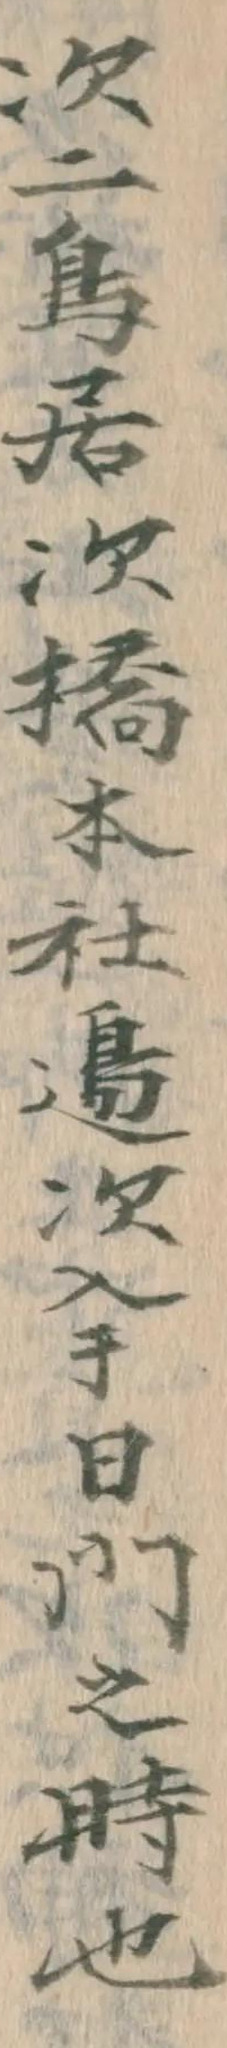次二鳥居次橋本社辺次入于日門之時也
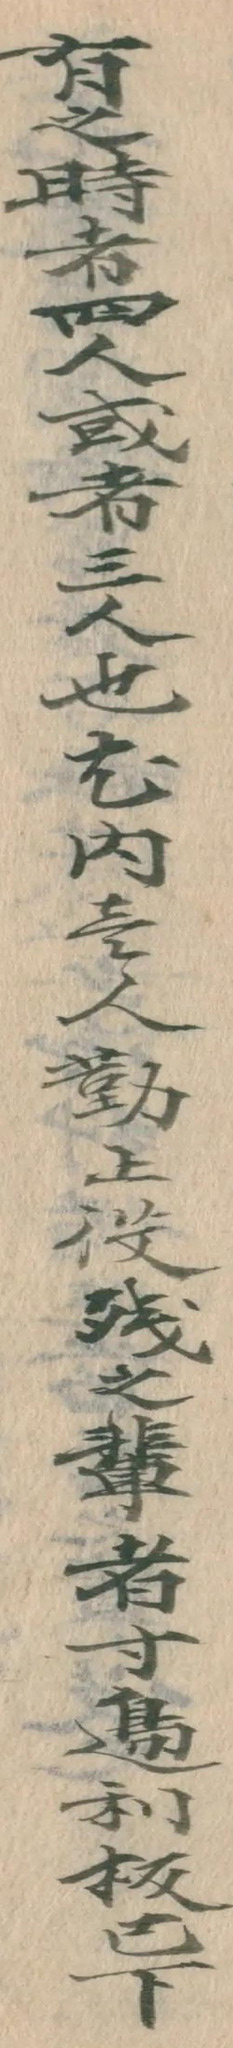有之時者四人或者三人也尤内壱人勤上役残之輩者寸辺利板已下
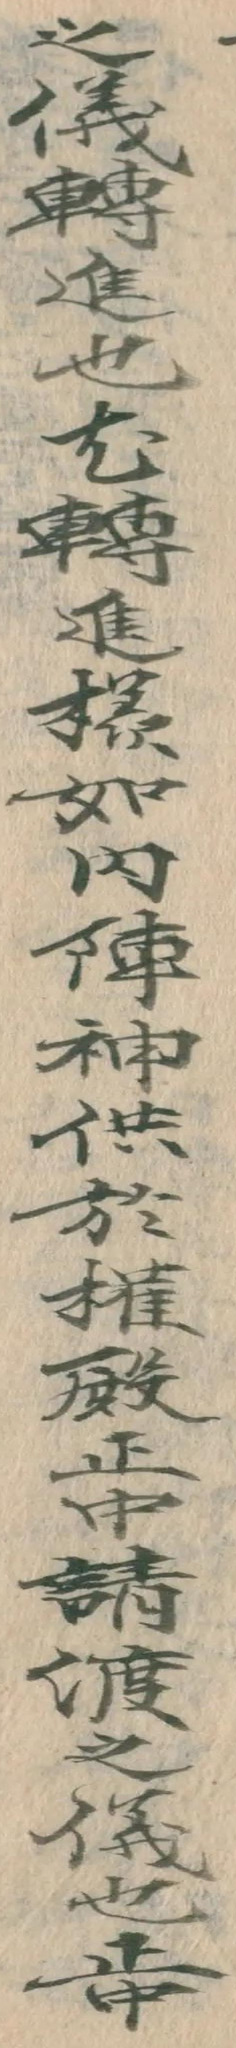之儀転進也尤転進様如内陣神供於権殿正中請渡之儀也正中
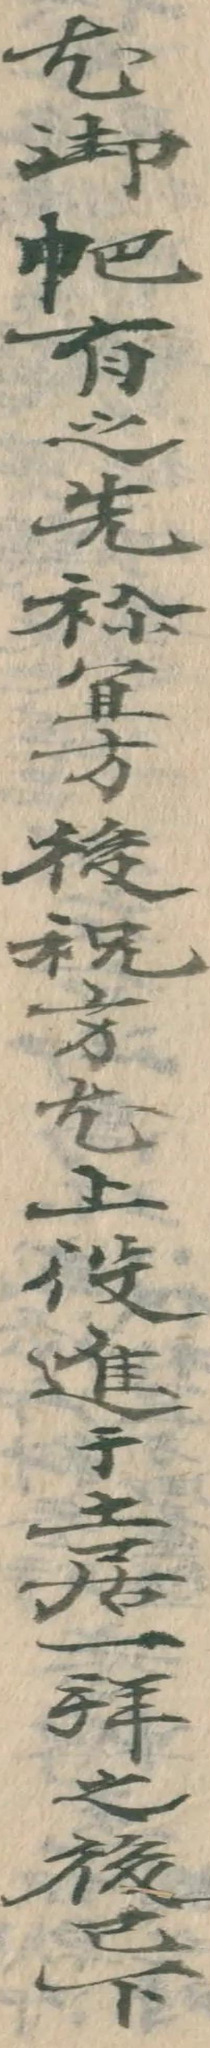尤御帊有之先祢宜方後祝方尤上役進于土居一拝之後已下
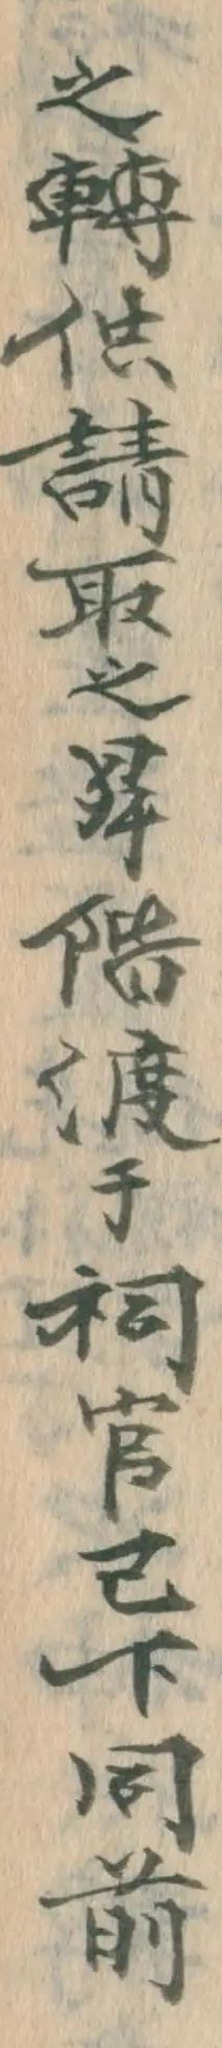之転供請取之昇階渡于祠官已下同前

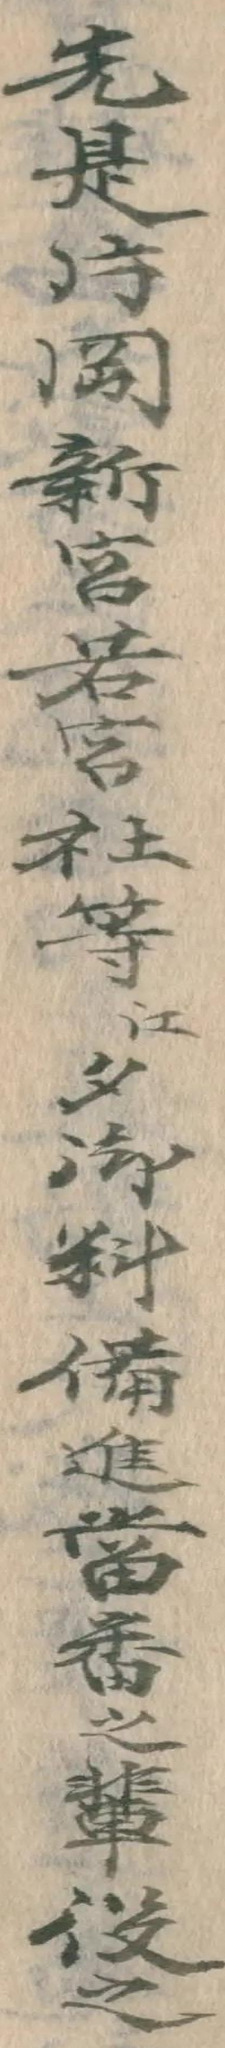先是片岡新宮若宮社等江夕御料備進当番之輩役之
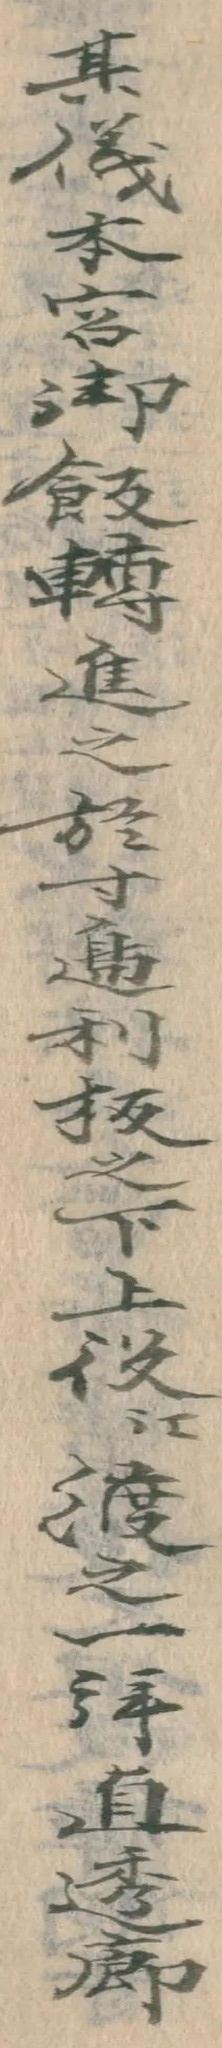其儀本宮御飯転進之於寸辺利板之下上役江渡之一拝直透廊
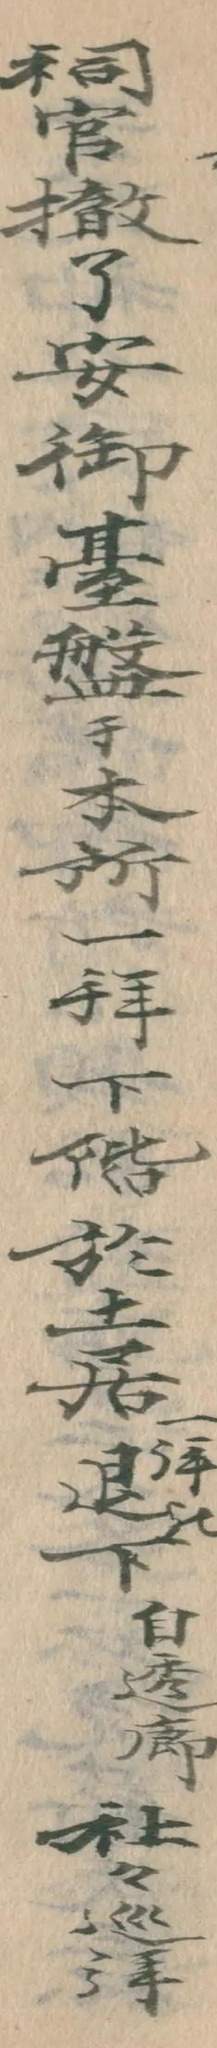祠官撤了安御台盤于本所一拝下階於土居退下自透廊社々巡拝
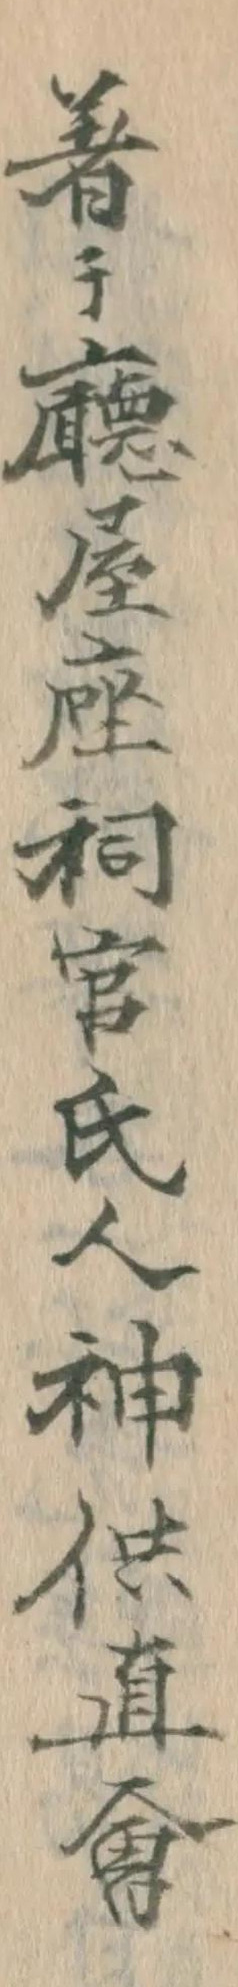着于庁屋座祠官氏人神供直会
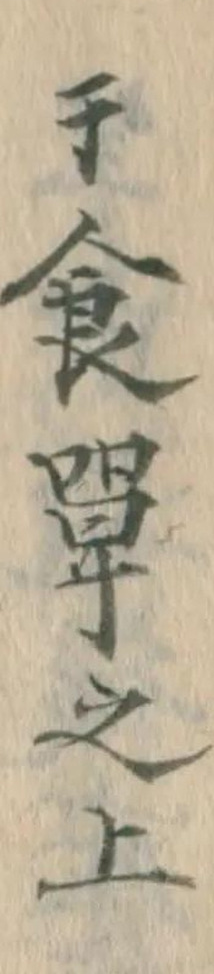于食単之上
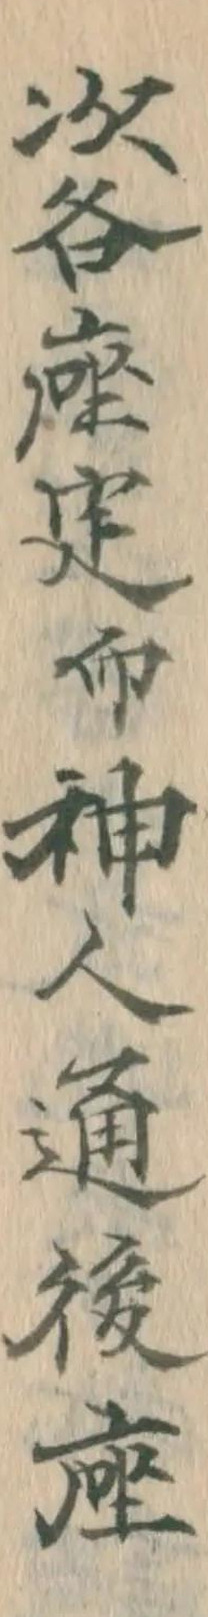次各座定而神人通後座
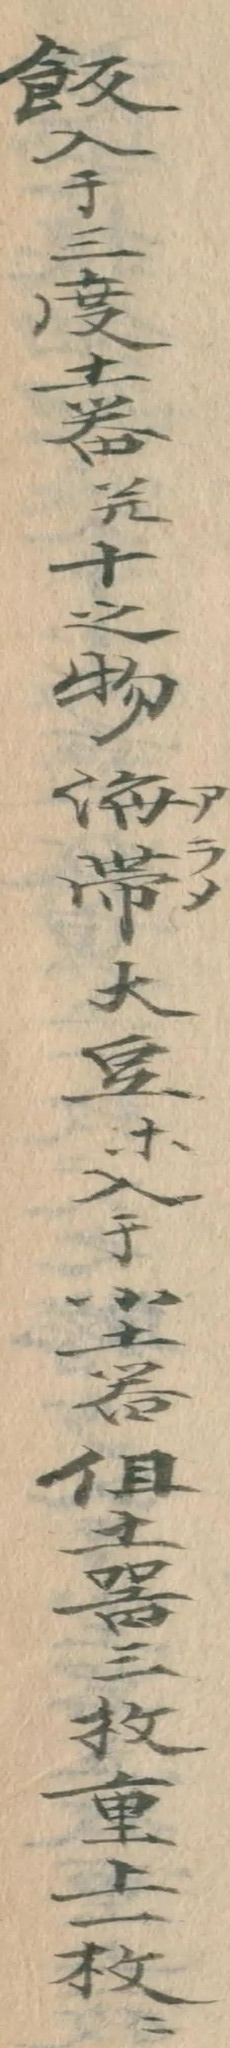飯入于三度土器并十之物海帯丈豆等入于小土器但土器三枚重上一枚ニ

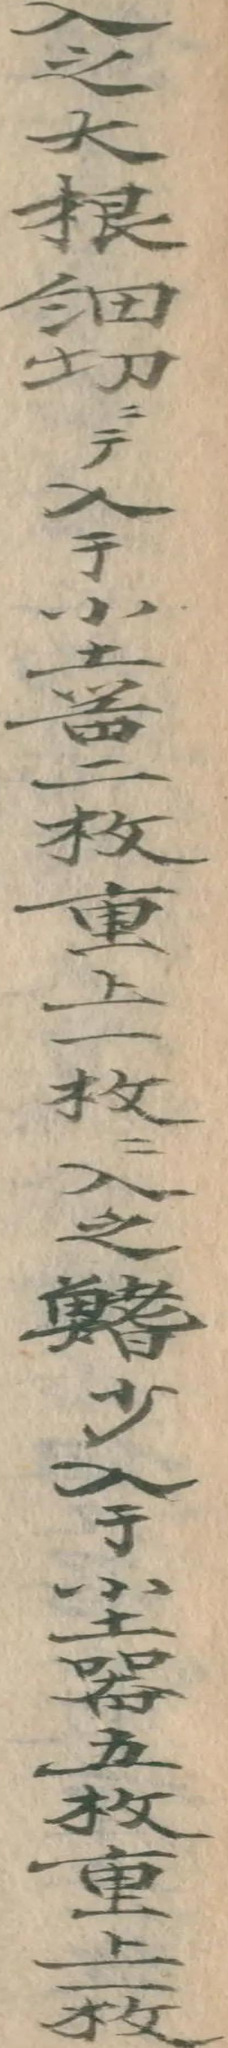入之大根細切ニテ入于小土器二枚重上一枚ニ入之鰭少入于小土器五枚重上一枚
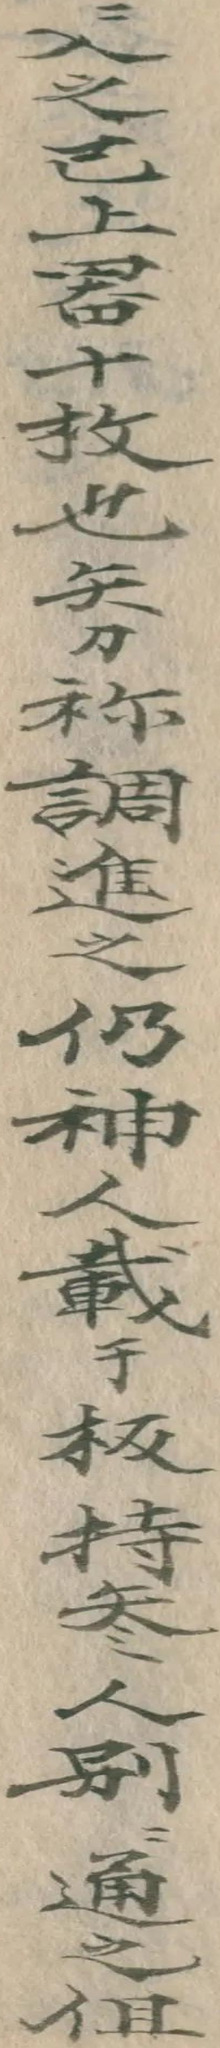ニ入之已上器十枚也矢刀祢調進之仍神人載于板持参人別ニ通之但
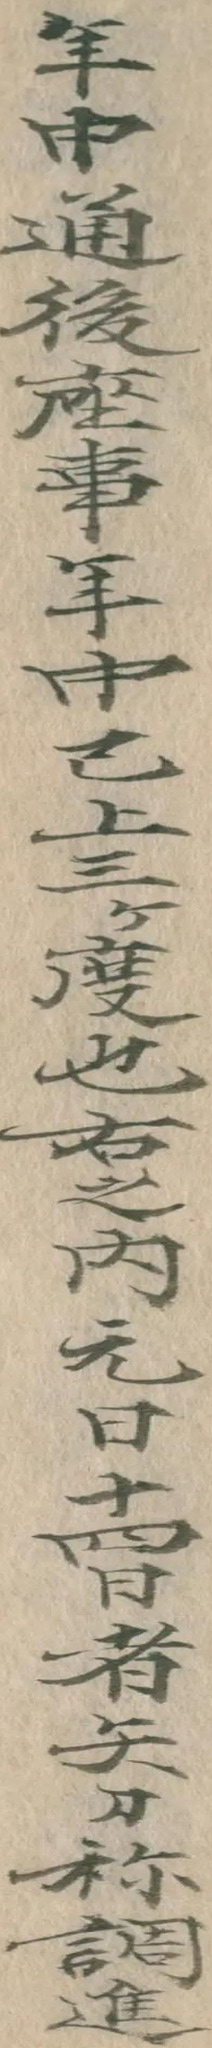年中通後座事年中已上三ケ度也右之内元日十四日者矢刀祢調進
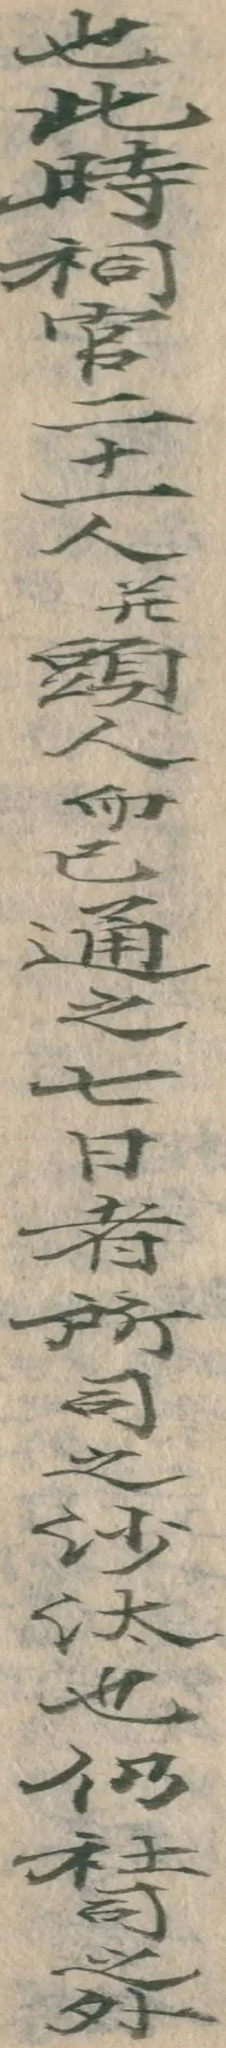也此時祠官二十一人并頭人而已通之七日者所司之沙汰也仍社司之外
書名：賀茂社記録. 第9冊
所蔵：国立国会図書館 National Diet Library, JAPAN
